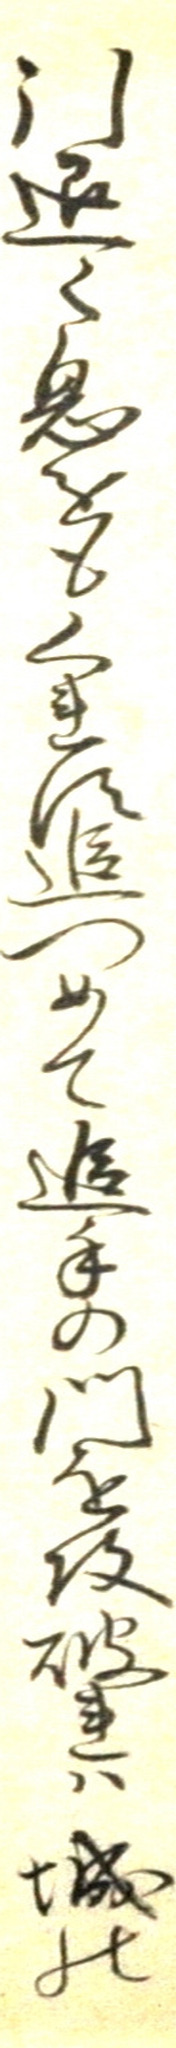引退く息をもくれす追つめて追手の門を攻破れは城の
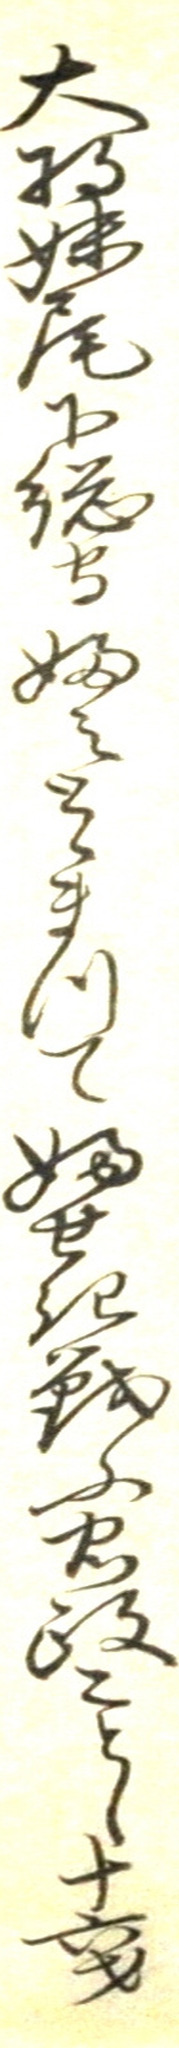大将妹尾下総守ふみとゝまつてふせき戦ふ忠政ことし十六才
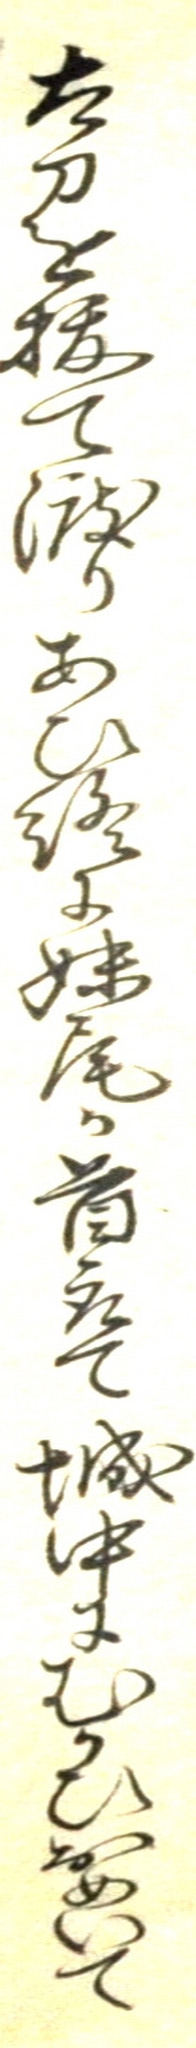太刀を抜て渡りあひ終に妹尾か首取て城中にむかひおめいて
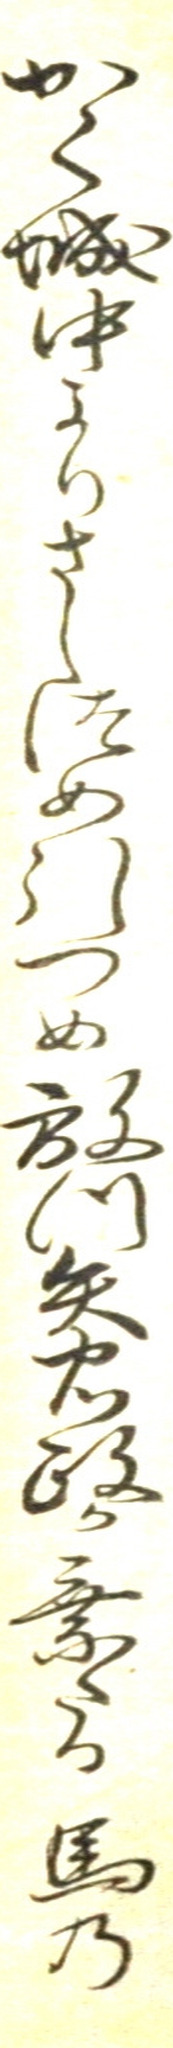かく城中よりさしつめ引つめ放つ矢忠政か乗たる馬の
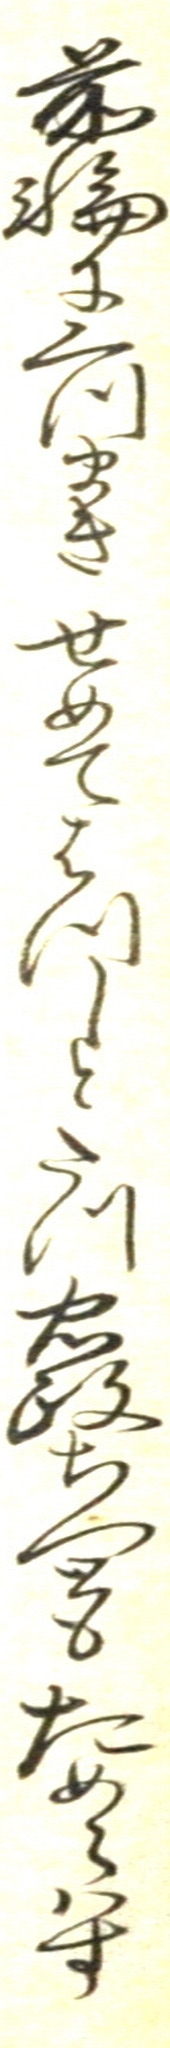前輪にくつまきせめてはつしとたつ忠政ちつともためらはす
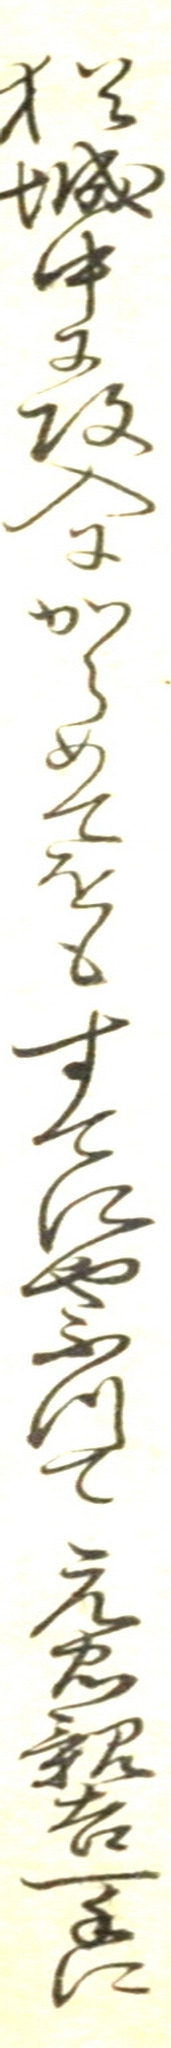猶城中に攻入にからめてをもすてにやふつて元忠親吉一手に
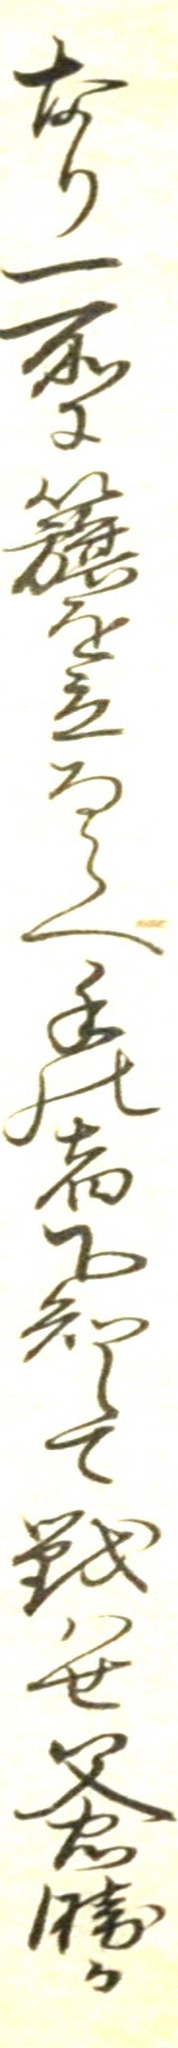なり一所に旗を立ならへ手の者下知して戦はせ父忠勝か
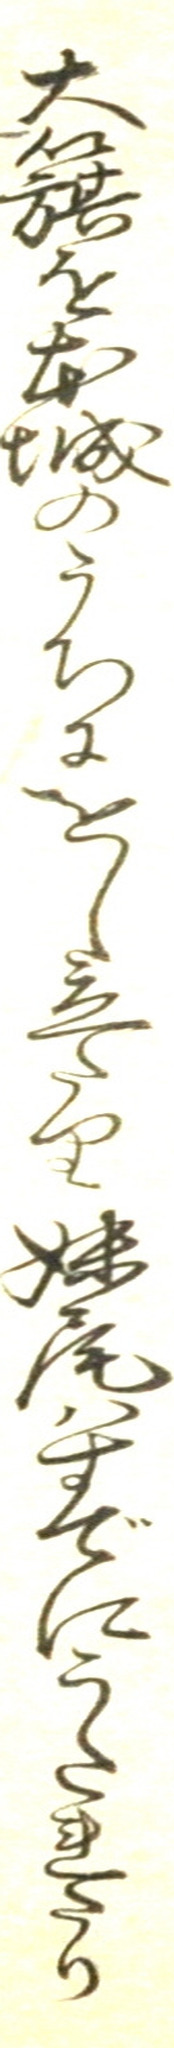大旗を本城のうちにをし立たり妹尾はすでにうたれたり
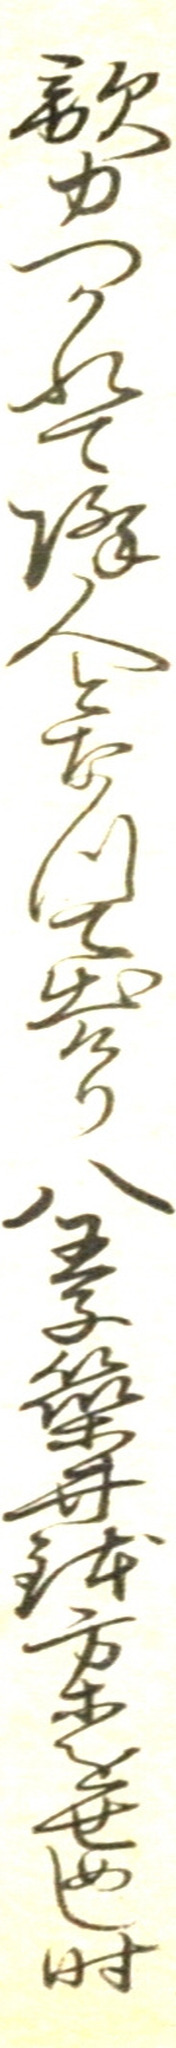敵力つかれて降人となつて出けり八王子築井鉢方等をせめし時
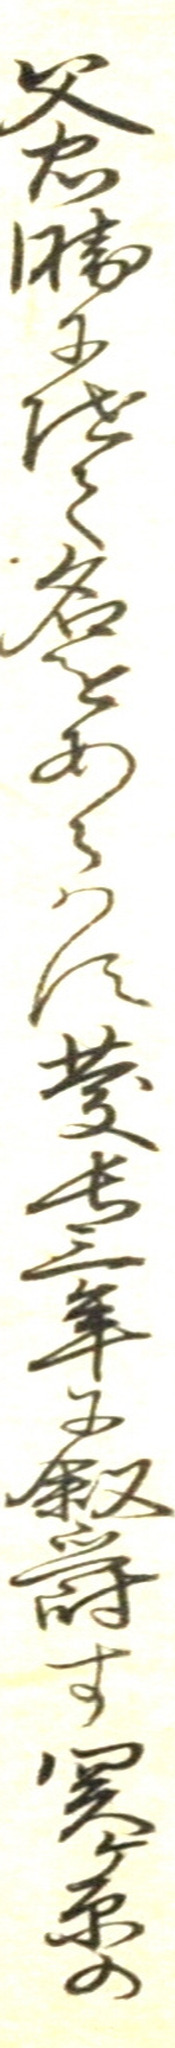父忠勝に随て名をあらはす慶長三年に叙爵す関ヶ原の
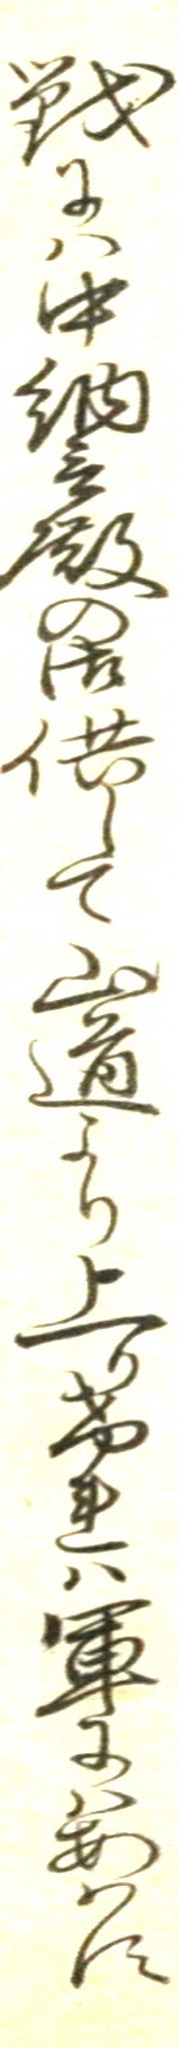戦には中納言殿の御供して山道より上りけれは軍にはあはす
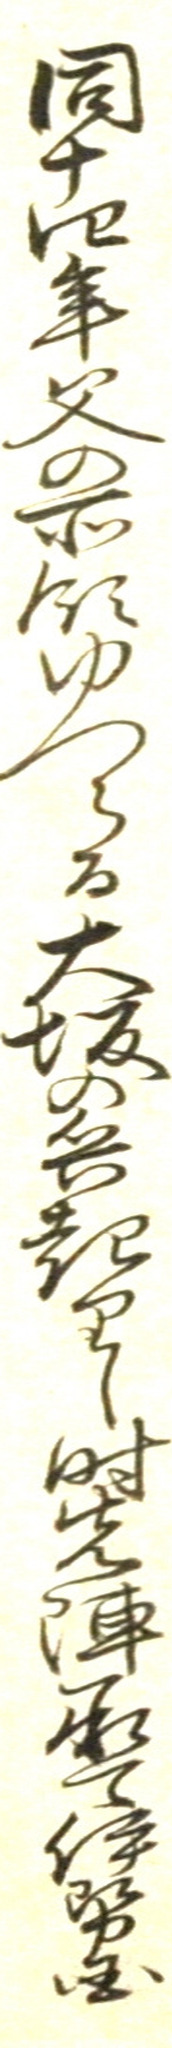同十四年父の所領ゆつらる大坂の兵起りし時先陣承て伊勢国
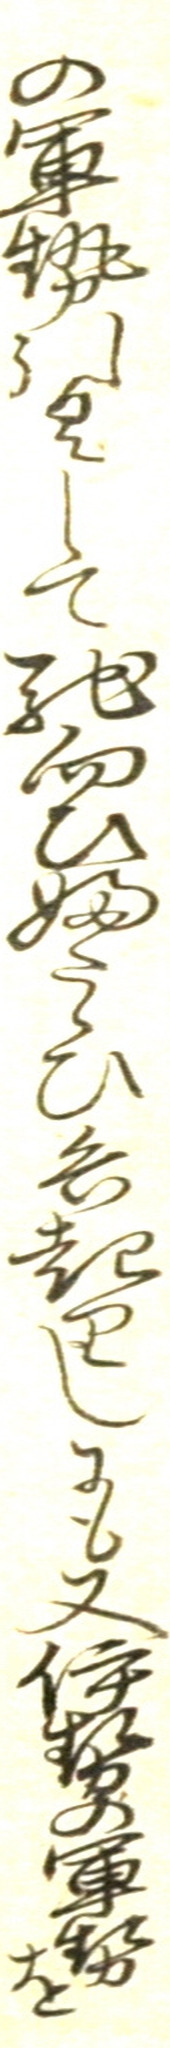の軍勢引具して馳向ひふたゝひ兵起りしにも又伊勢の軍勢を
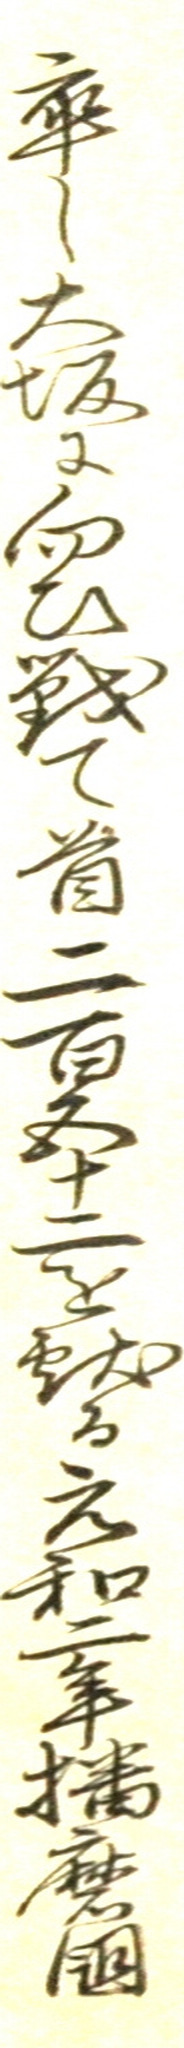卒し大坂に向ひ戦て首二百五十二を献る元和二年播磨国

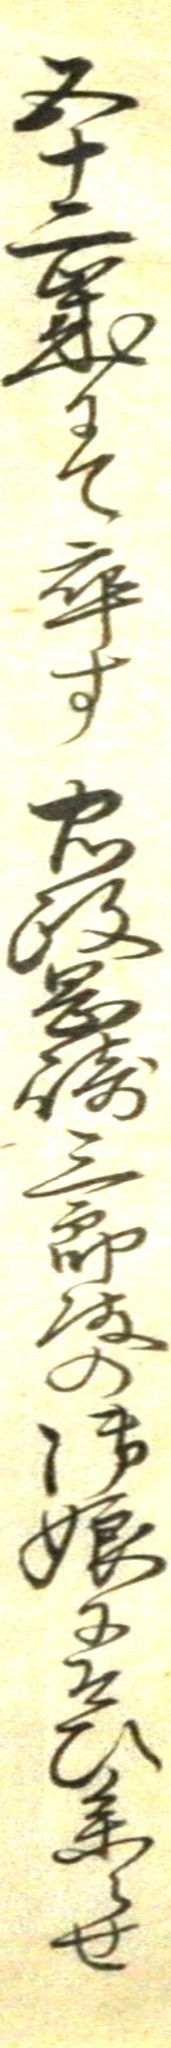五十二歳にて卒す忠政岡崎三郎殿の御娘子にそひ参らせ
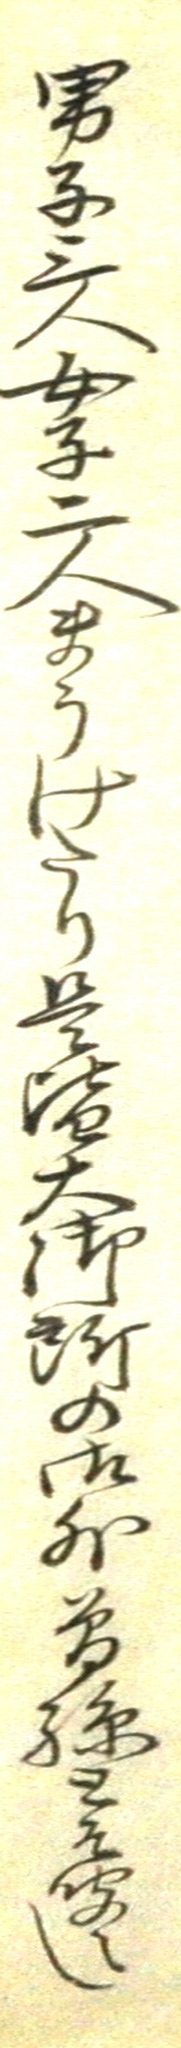男子三人女子二人まうけたり是皆大御所の御外曾孫とそ聞えし
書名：藩翰譜（四・上）
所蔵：伊那市立高遠町図書館・合同会社AMANE
